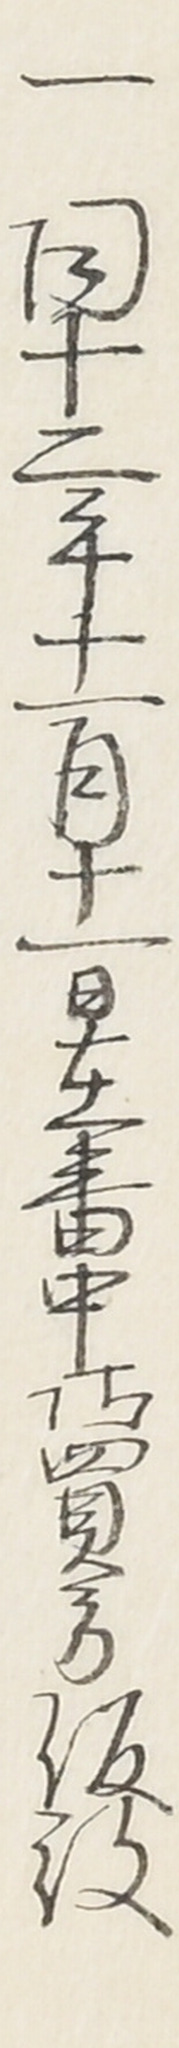一同十二午十一月十一日在番中御買方仮役
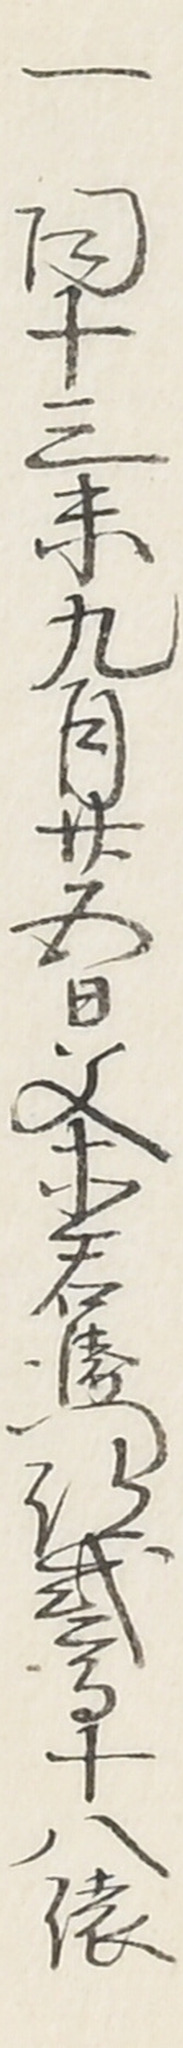一同十三未九月廿五日父直右衛門跡式高十八俵
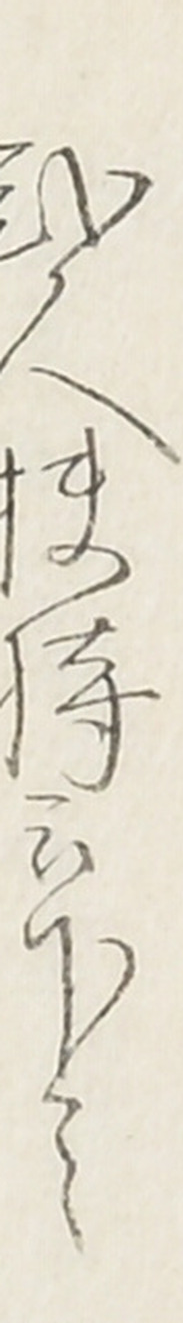弐人扶持被下之
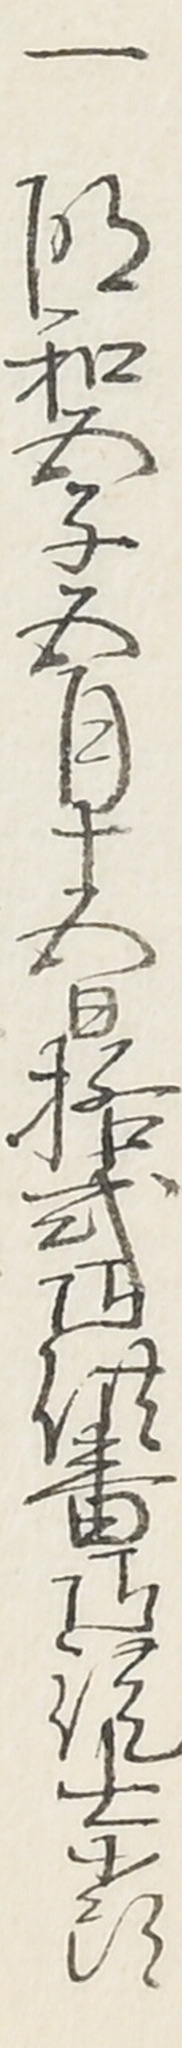一明和五子五月十五日格式御供番御徒士小頭
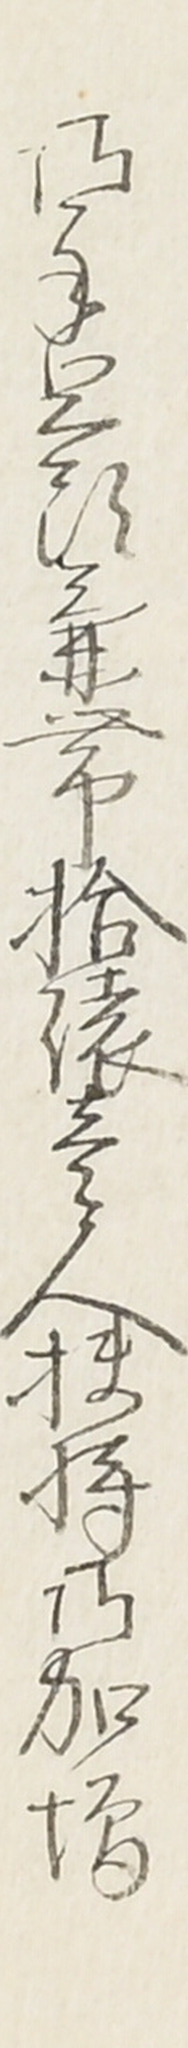御手廻頭兼帯拾俵壱人扶持御加増
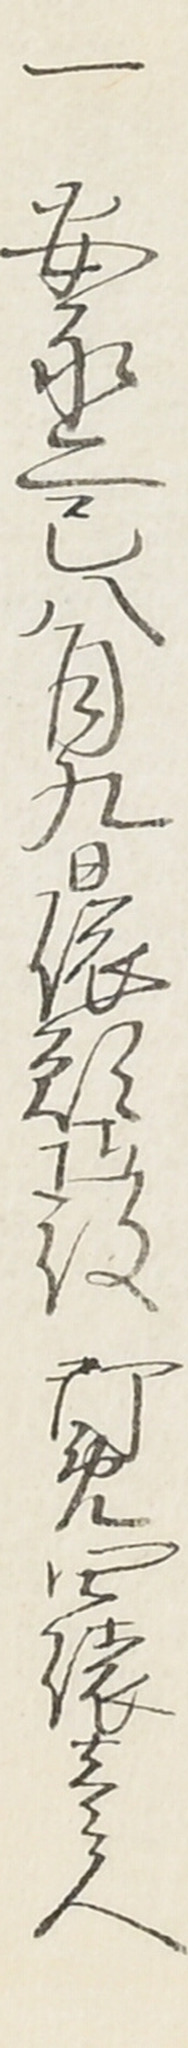一安永二巳八月九日依願御役御免四俵壱人
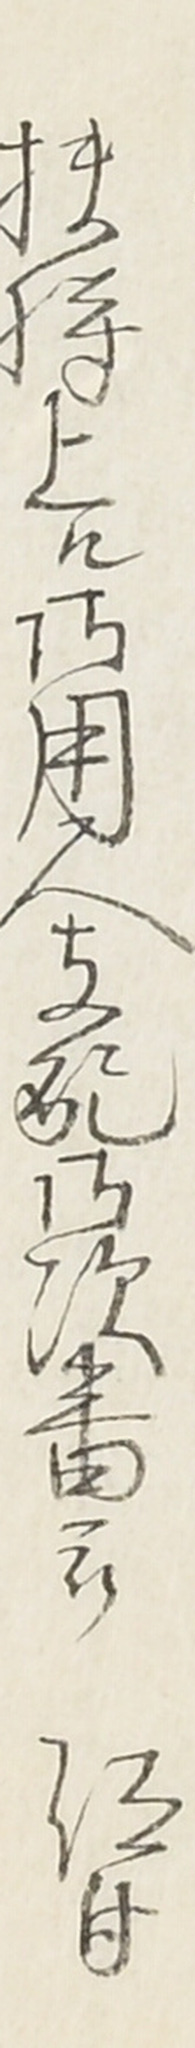扶持上ㇽ御用人支配御次番被仰付
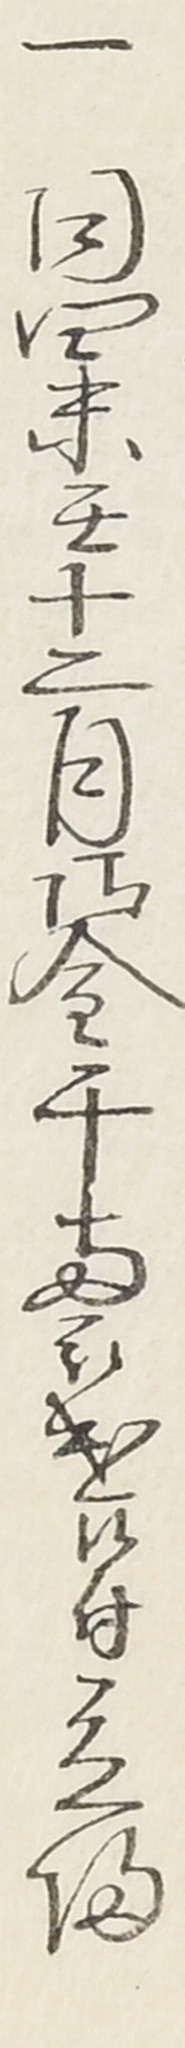一同四未閏十二月御金千両被遣候付立帰
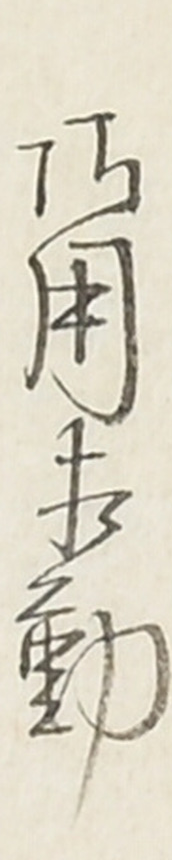御用相勤
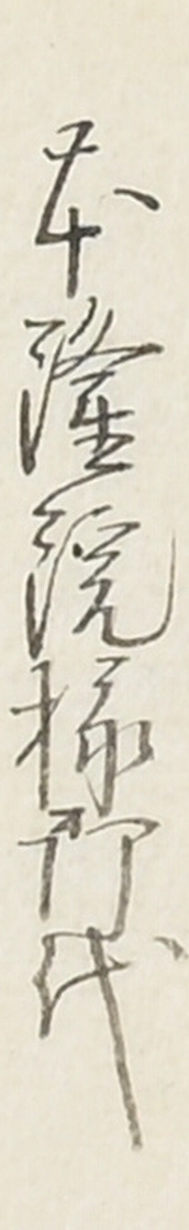本隆院様御代
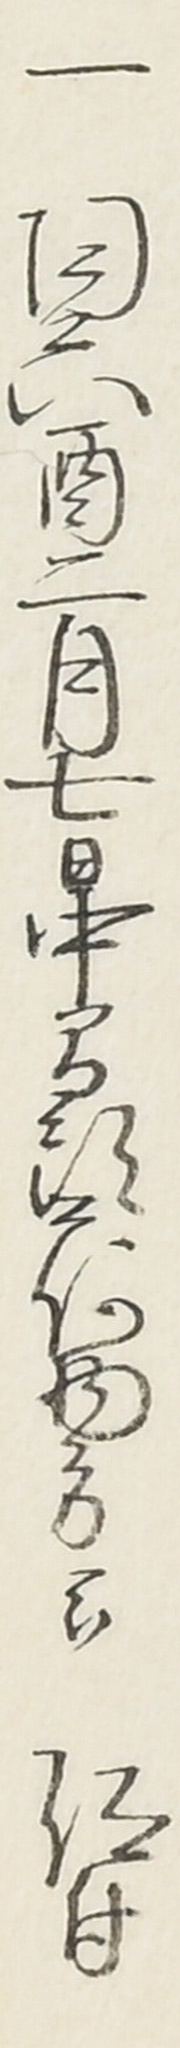一同六酉二月七日中間頭荷物方被仰付
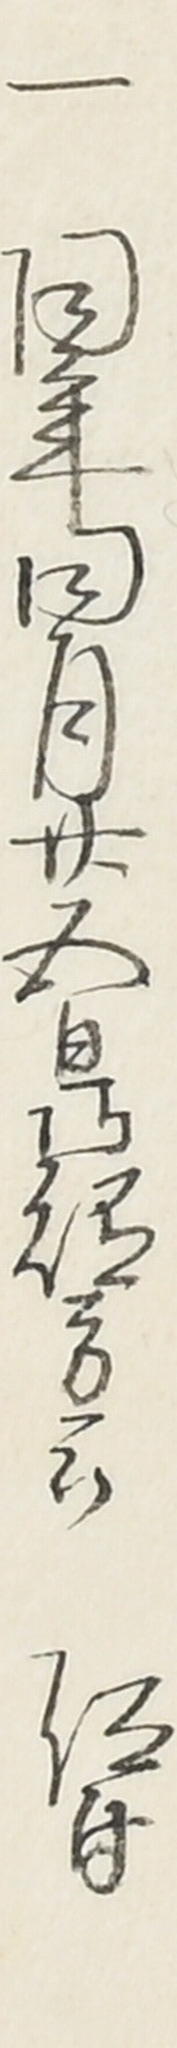一同年四月廿五日御賄方被仰付
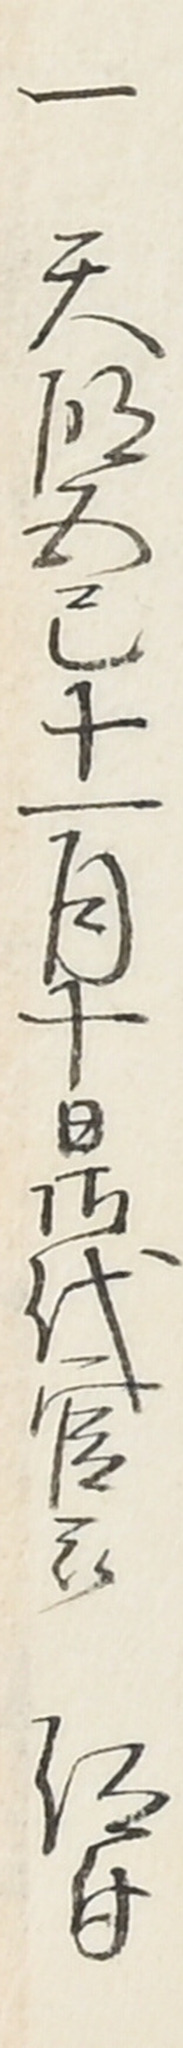一天明五巳十一月十日御代官被仰付

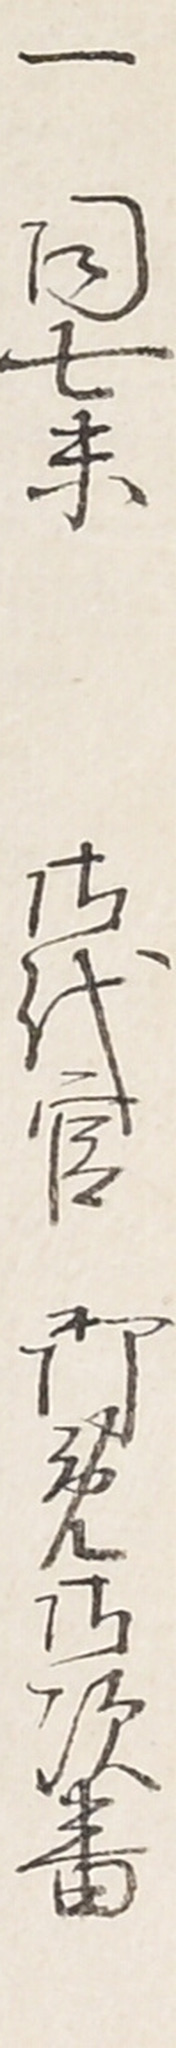一同七未御代官御免御次番
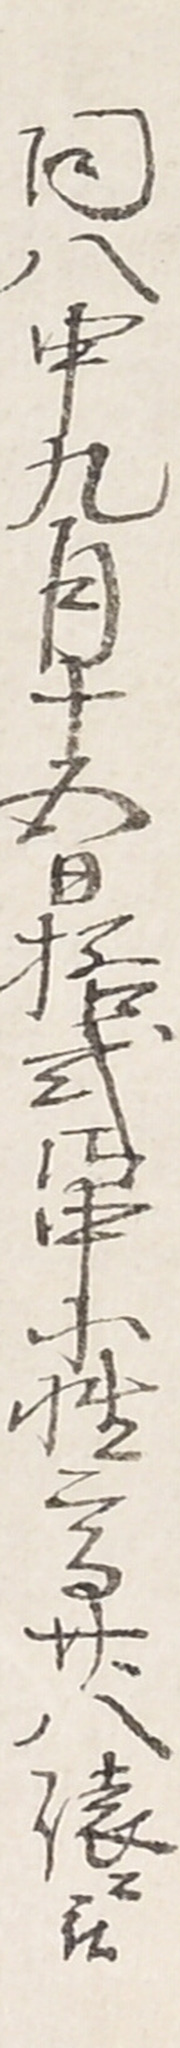一同八申九月十五日格式御中小性高廿八俵ニ被
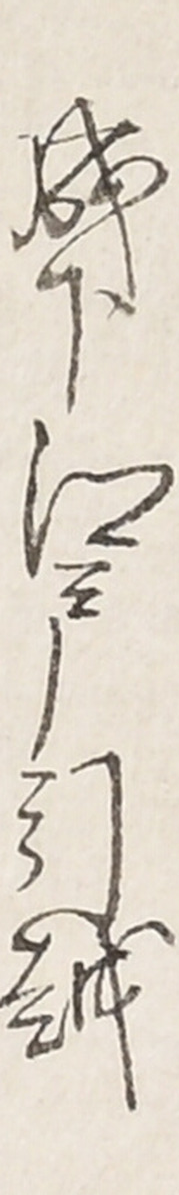成下江戸引越
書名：無足諸士勤仕録（四）
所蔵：伊那市立高遠町図書館・合同会社AMANE
